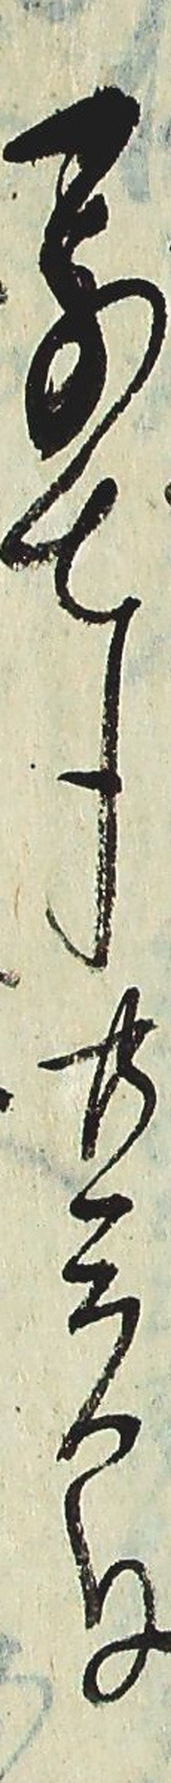子七月廿三日
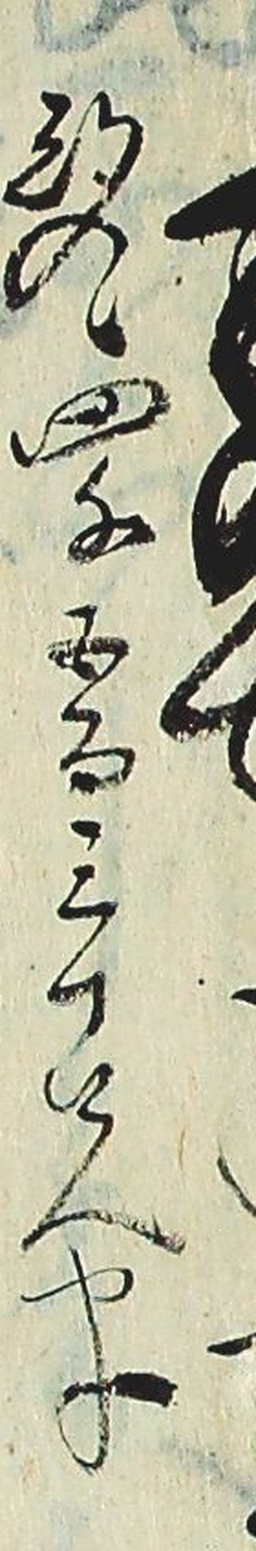都合四千五百三十四人半

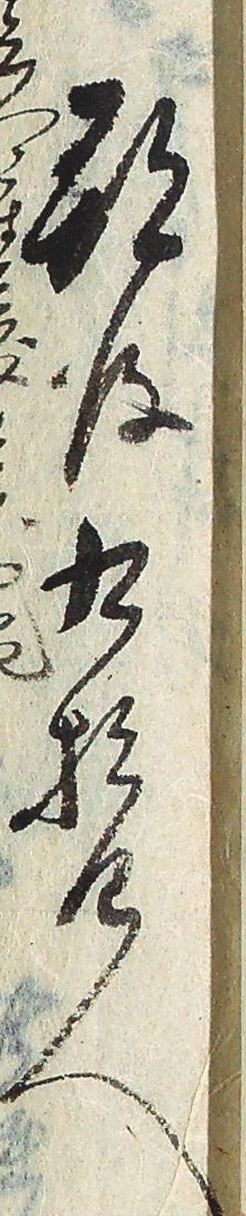郡役九拾四人
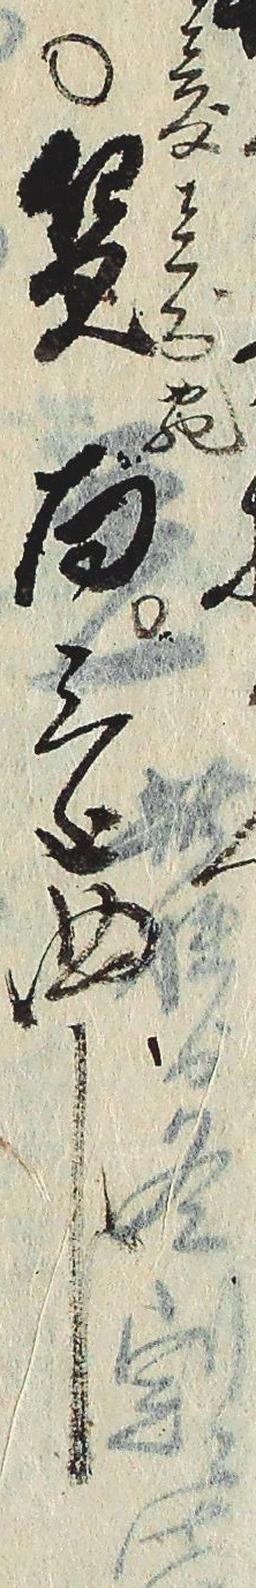賃百〇三匁四分
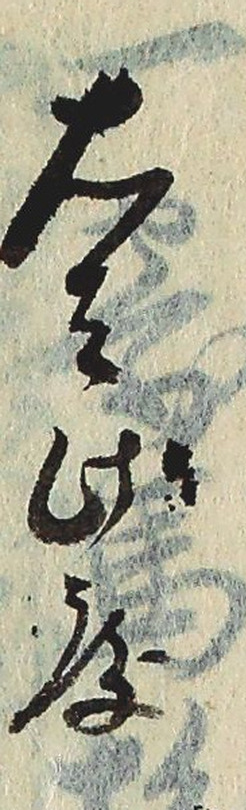右は此度
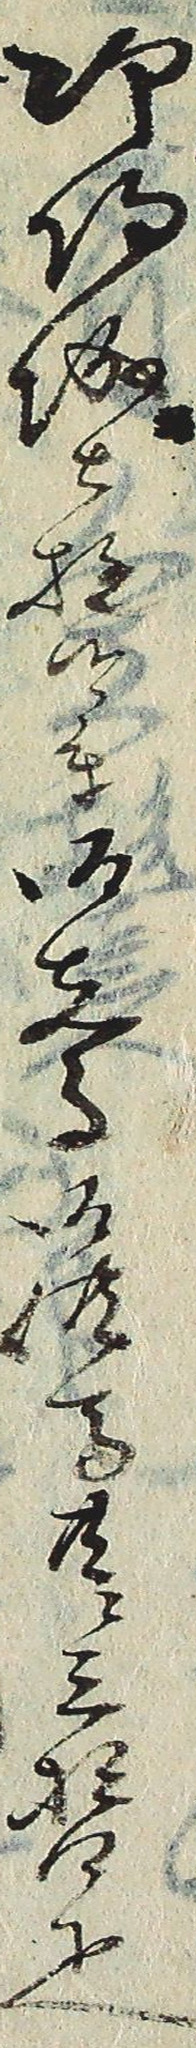御帰城被遊候に付御先馬御供馬共に三拾四疋
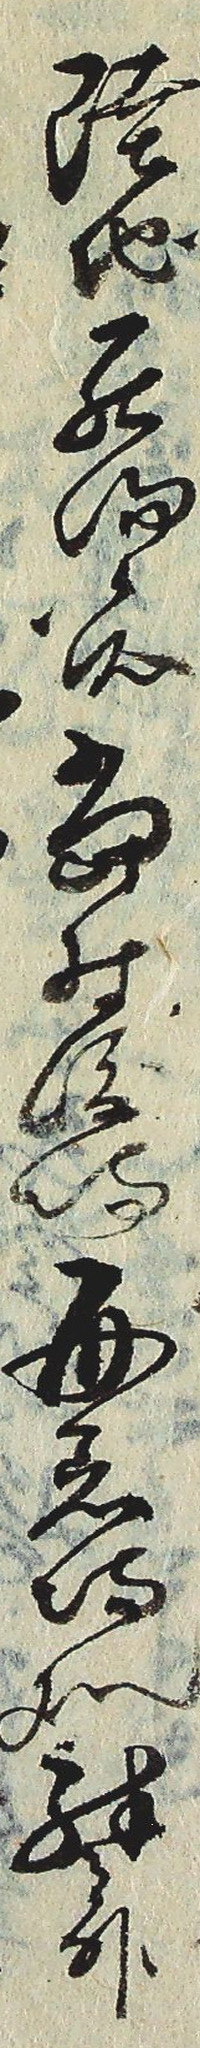陸地罷帰候所当村渡場舟着場処殊之外
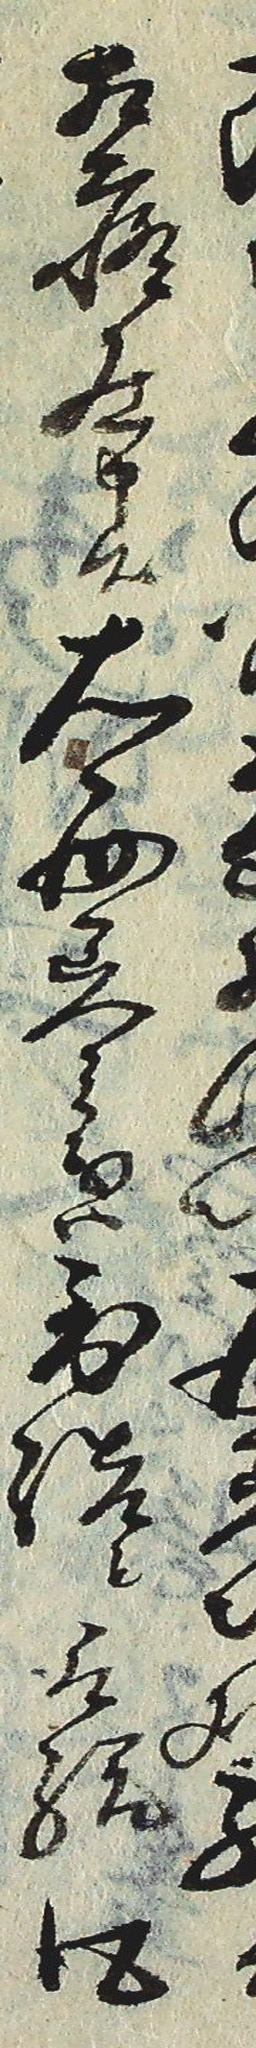相疼居申候右舟着之義は到詰に取繕仕
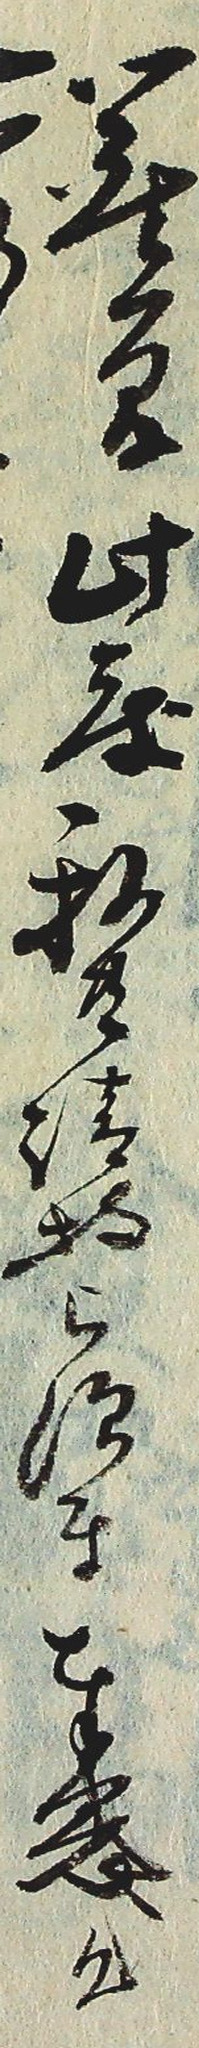御座候間此度私共請持被仰付奉畏候
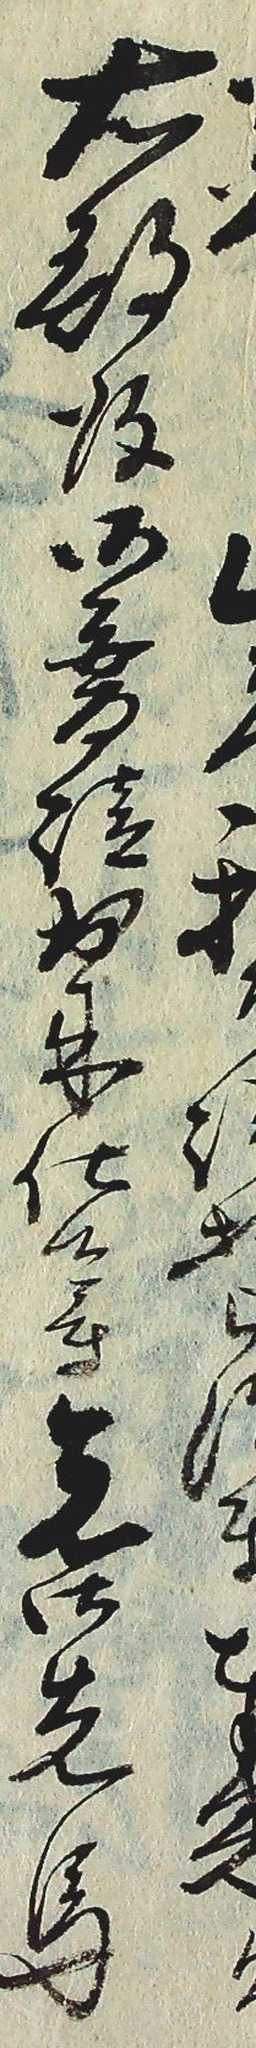右郡役御普請出来仕候に付先御先馬
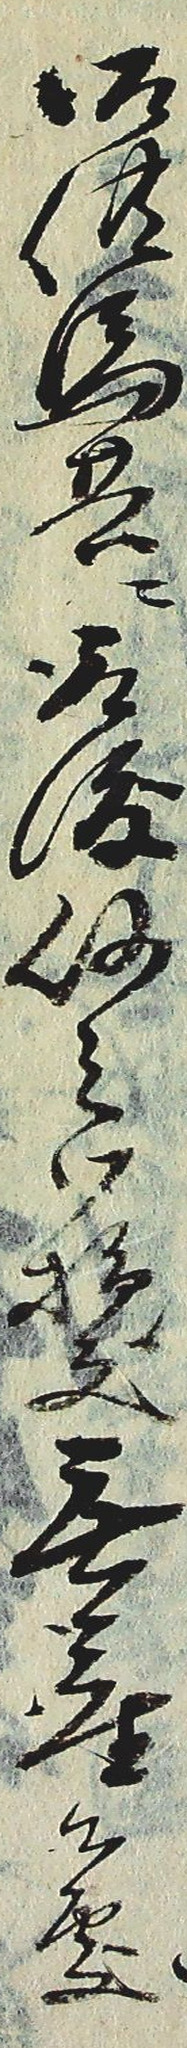御供馬共に取渡何之御指支無御座候処
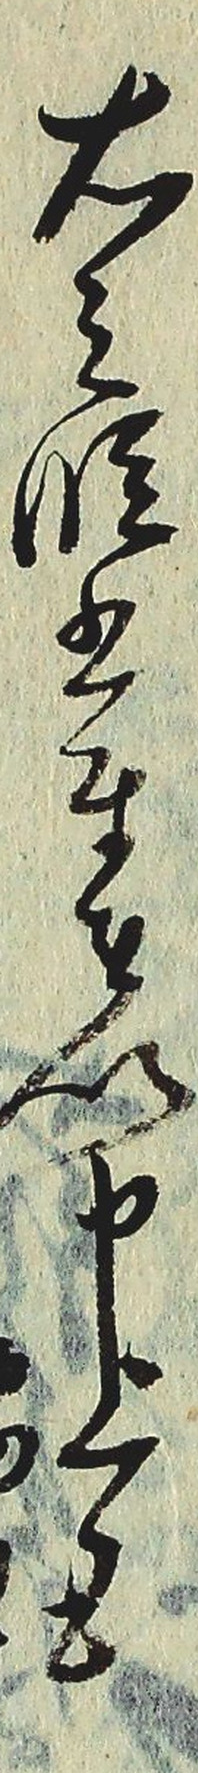右之段書付を以申上候以上
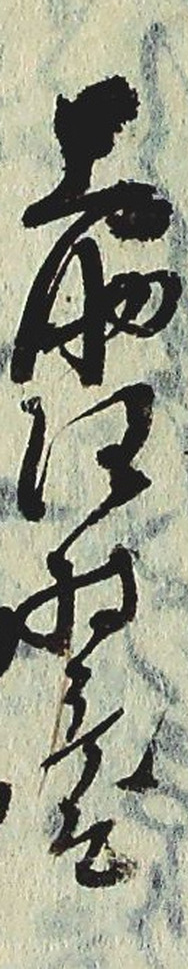上助任村庄屋
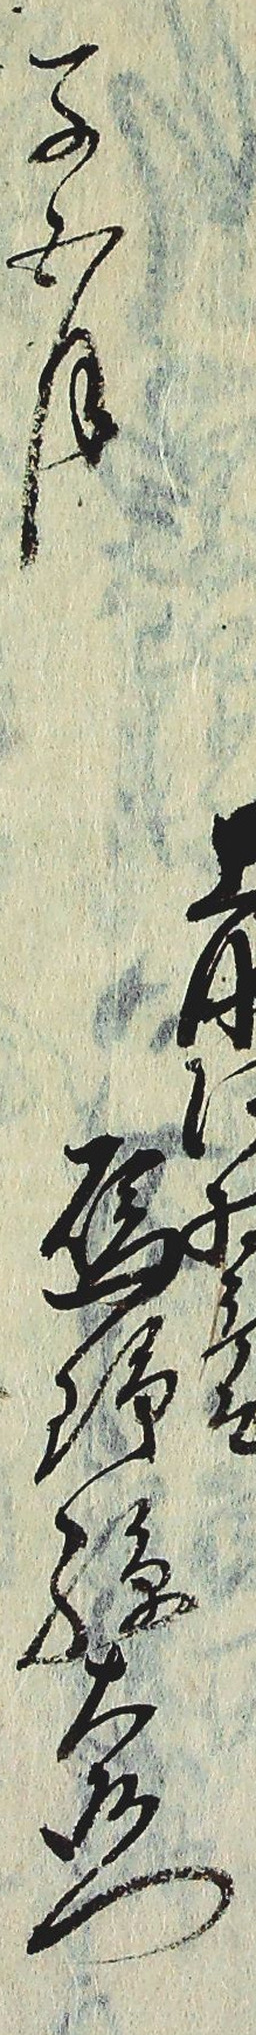子五月鷹野孫右衛門
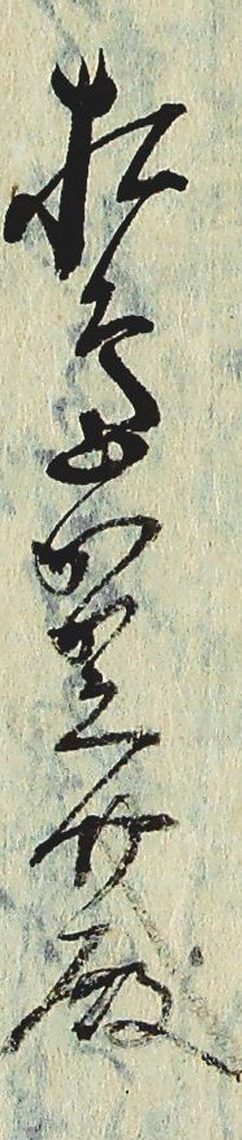松島加賀介殿
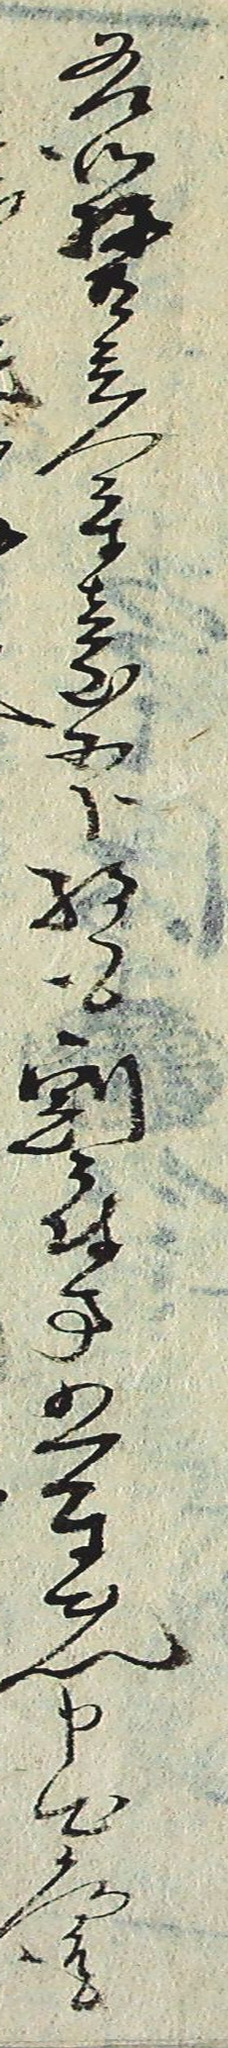右弐株共壱人に付壱匁五分余も割苻方書付を以申出御座候得とも
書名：名東郡中諸割賦元帳
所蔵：鳴門教育大学 Naruto University of Education
